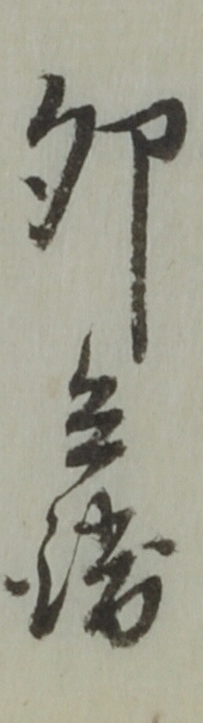卯兵衛
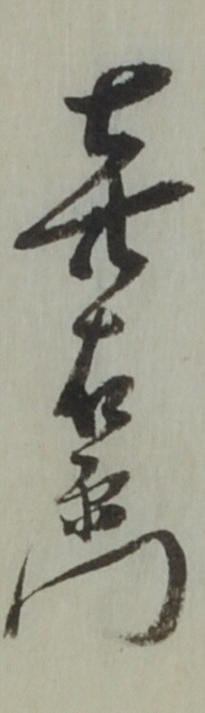喜右衛門
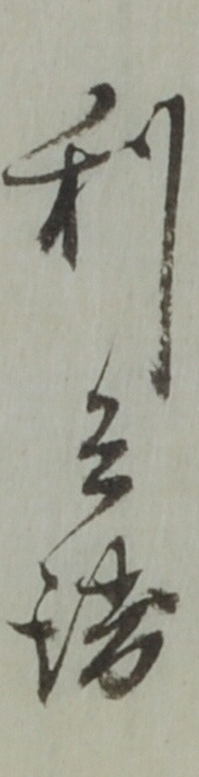利兵衛
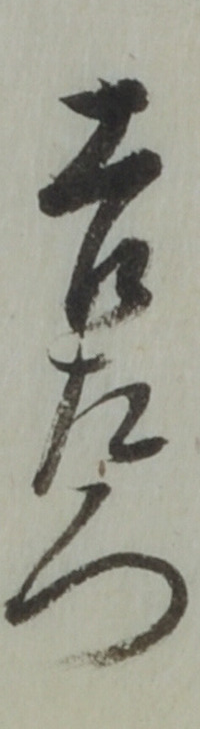吉左衛門

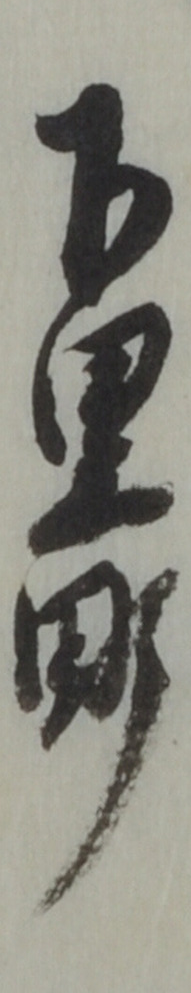下里町
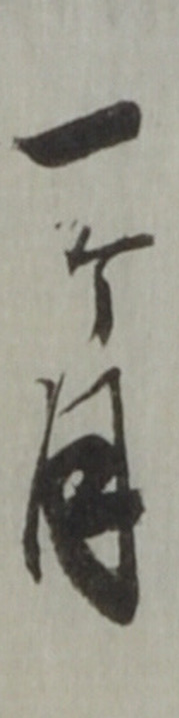一ケ月
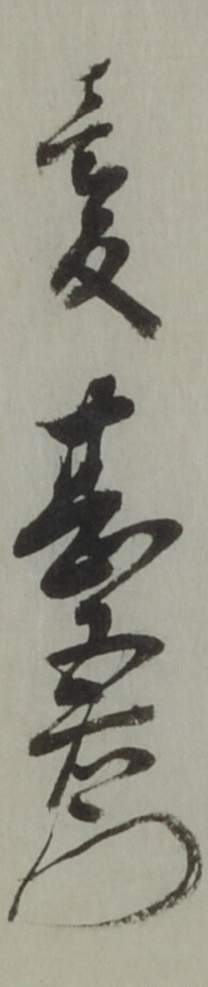壱反甚五右衛門
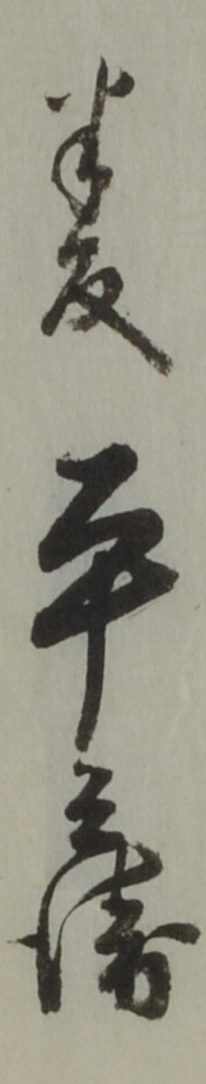半反平兵衛
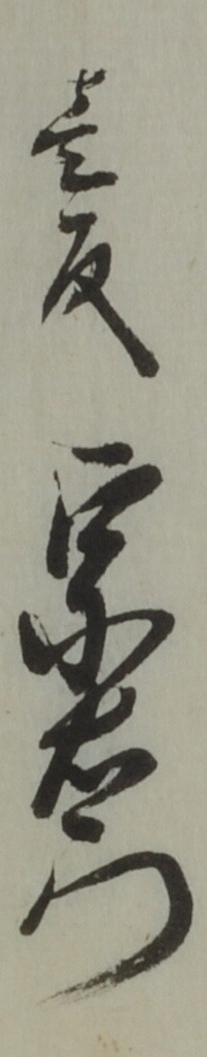壱反宗右衛門
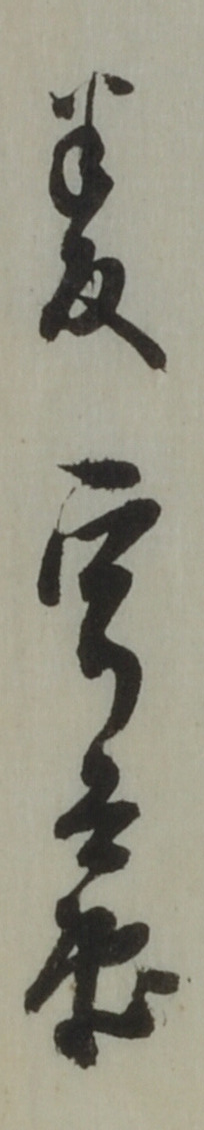半反宇兵衛
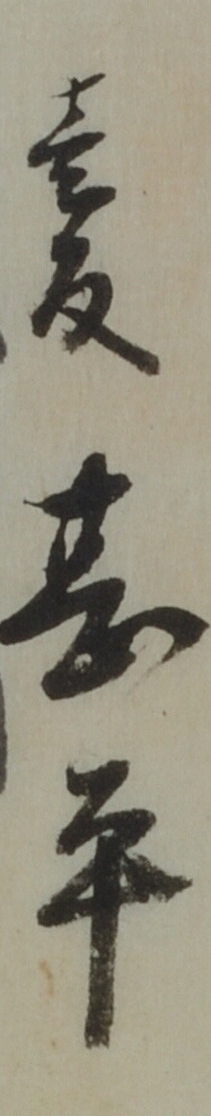壱反甚平
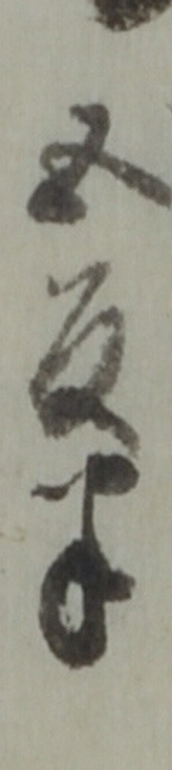五反半
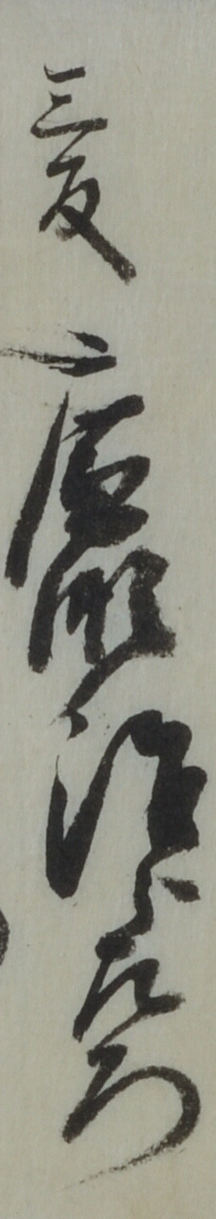三反広瀬治郎左衛門
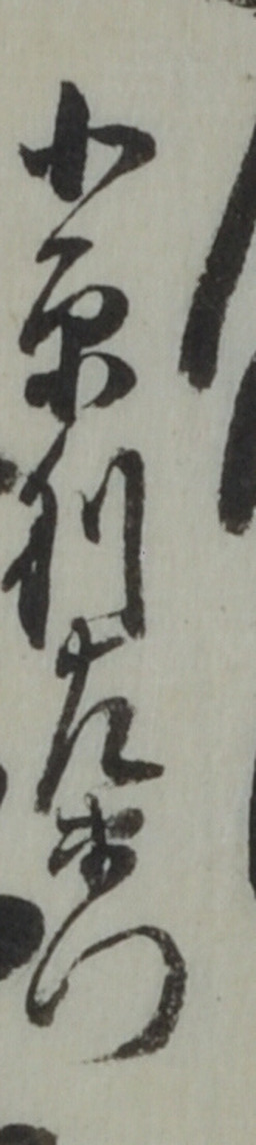北原利左衛門
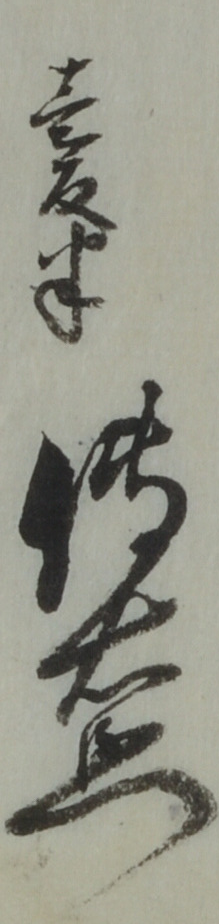壱反半伝右衛門
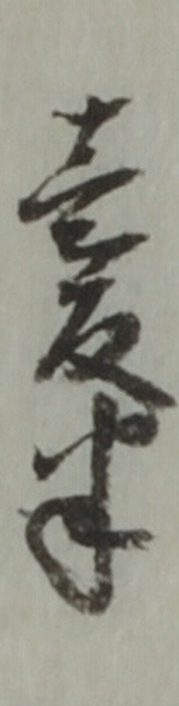五反半
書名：融通割合帳
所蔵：伊那市立高遠町図書館・合同会社AMANE
